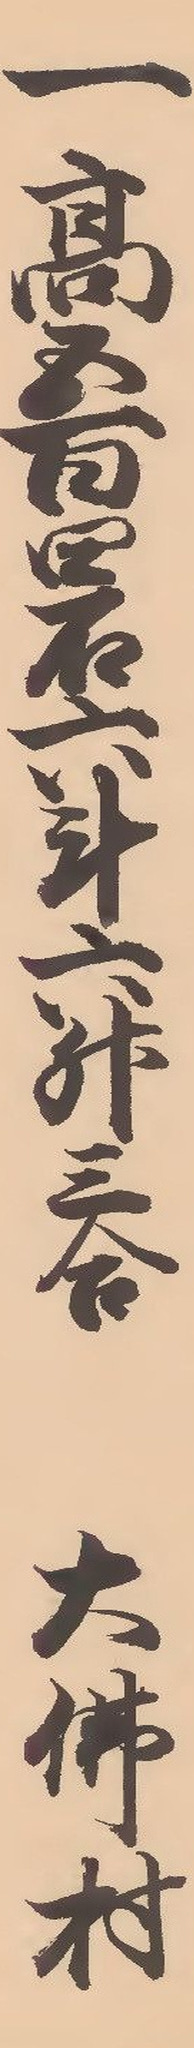一高五百四石六斗六升三合大仏村
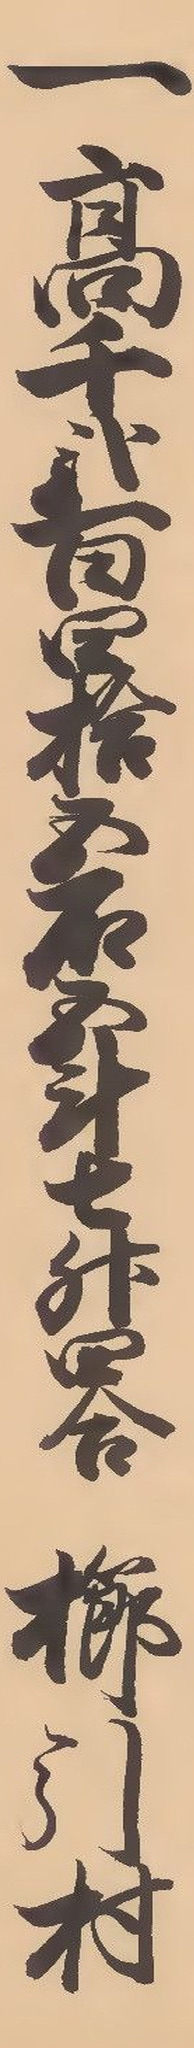一高千弐百四拾五石五斗七升四合櫛引村
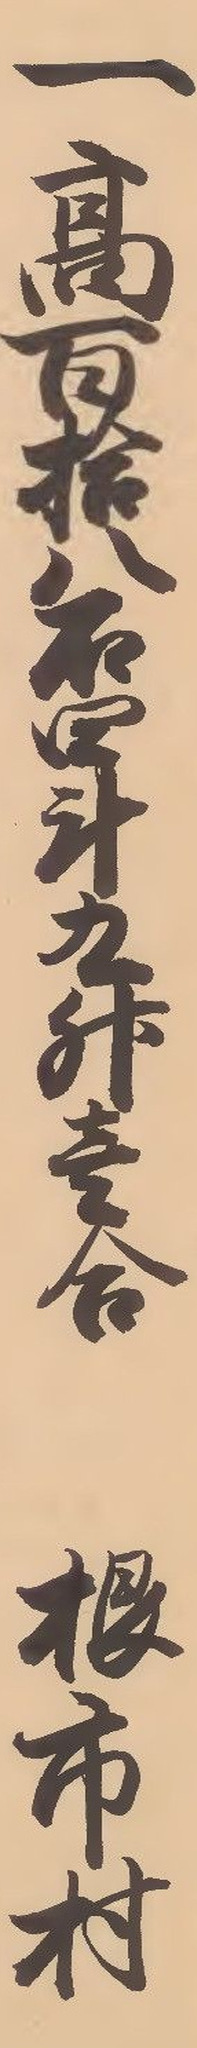一高百拾八石四斗九升壱合根市村
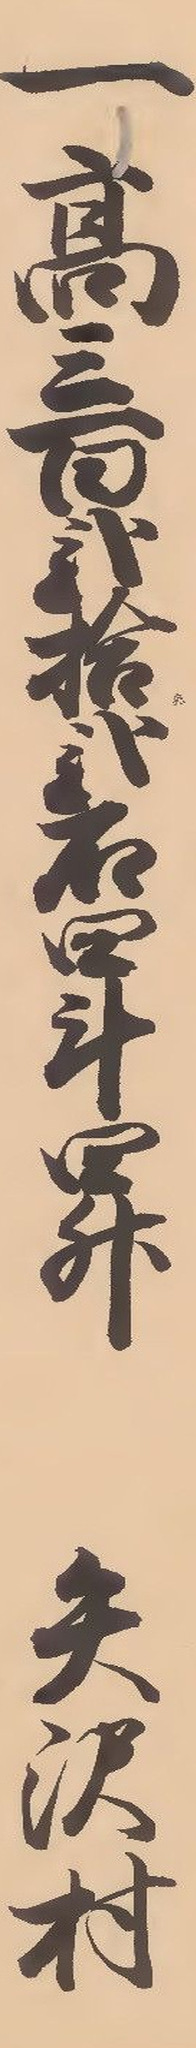一高三百弐拾弐石四斗四升矢沢村
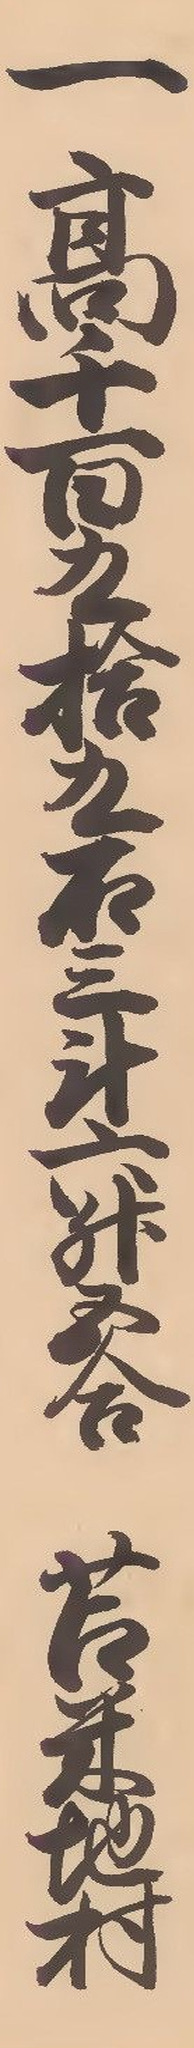一高千百九拾九石三斗六升五合苫米地村

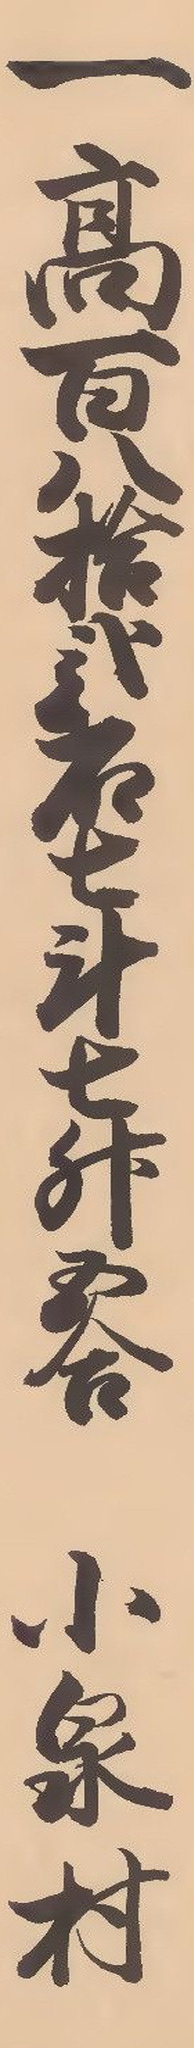一高百八拾弐石七斗七升五合小泉村
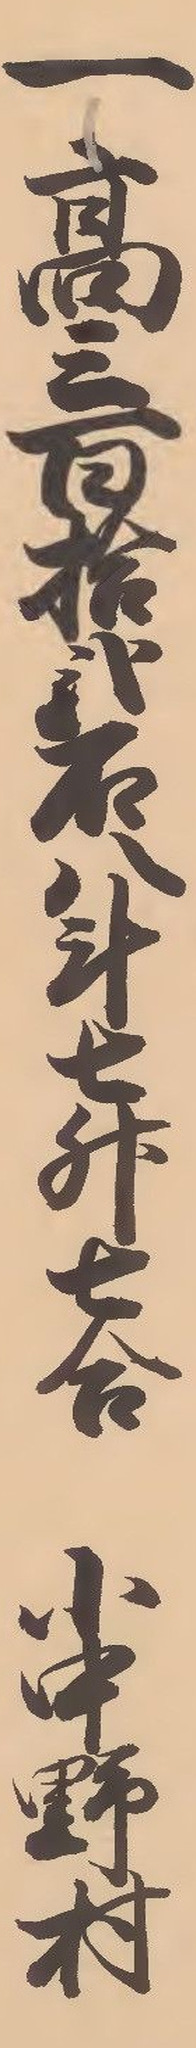一高三百拾弐石八斗七升七合小中野村
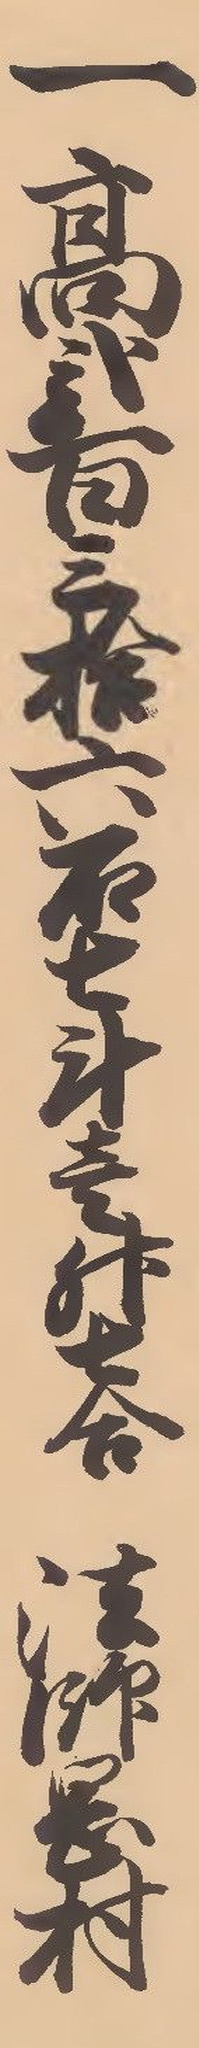一高弐百三拾六石七斗壱升七合法師岡村
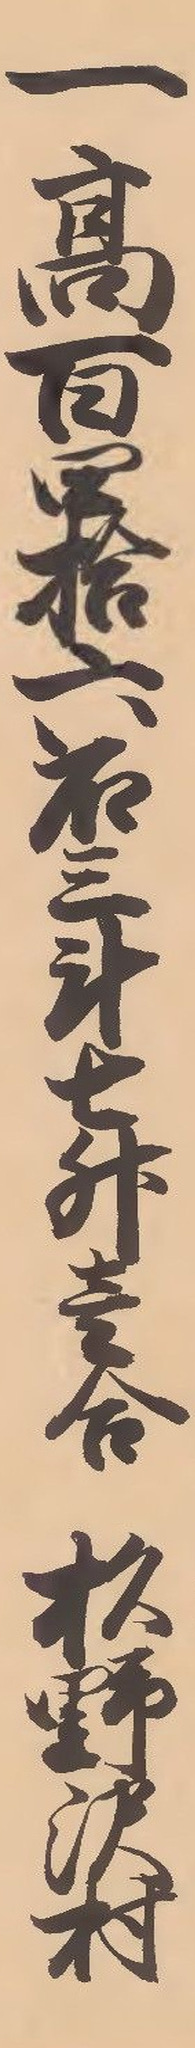一高百四拾六石三斗七升壱合杉野沢村
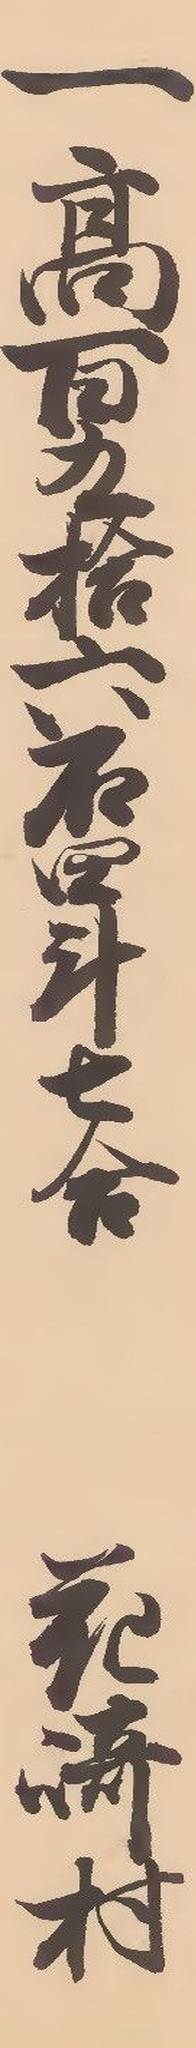一高百九拾六石四斗七合花崎村
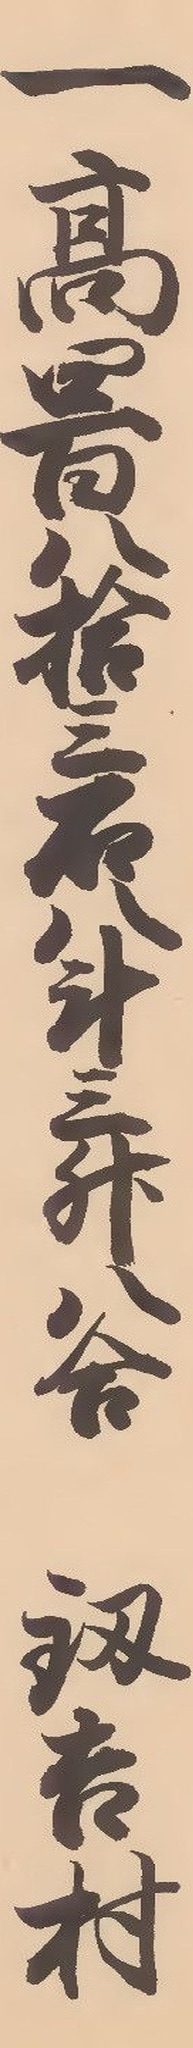一高四百八拾三石八斗三升八合釼吉村
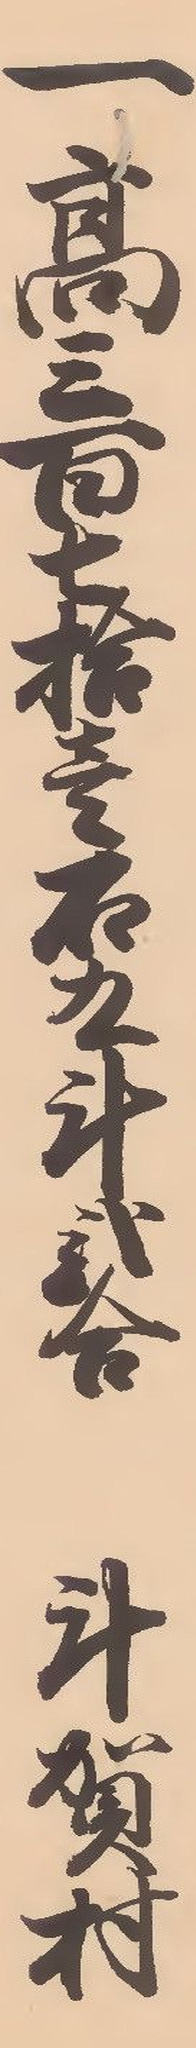一高三百七拾壱石九斗弐合斗賀村
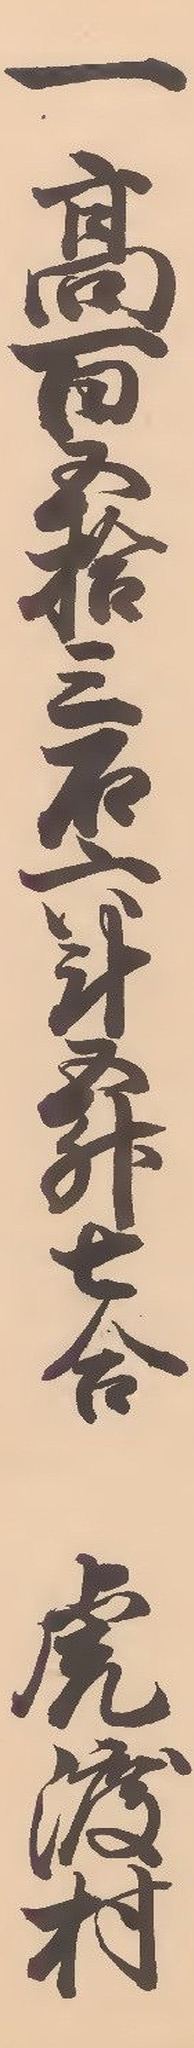一高百五拾三石六斗五升七合虎渡村

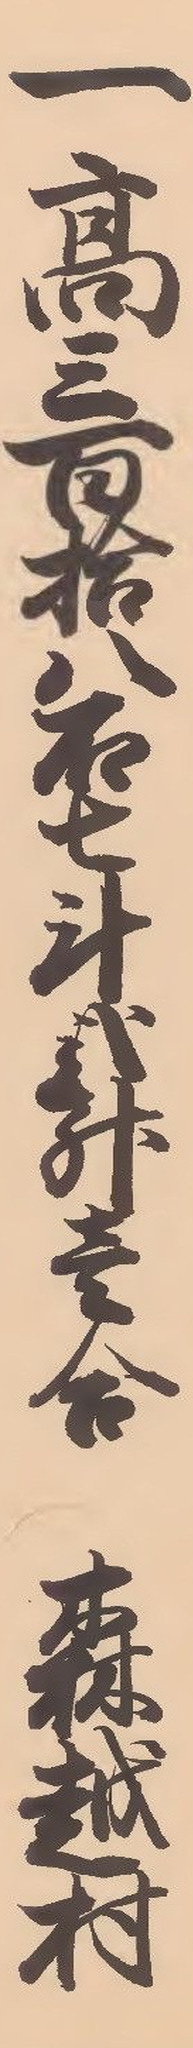一高三百拾八石七斗弐升壱合森越村
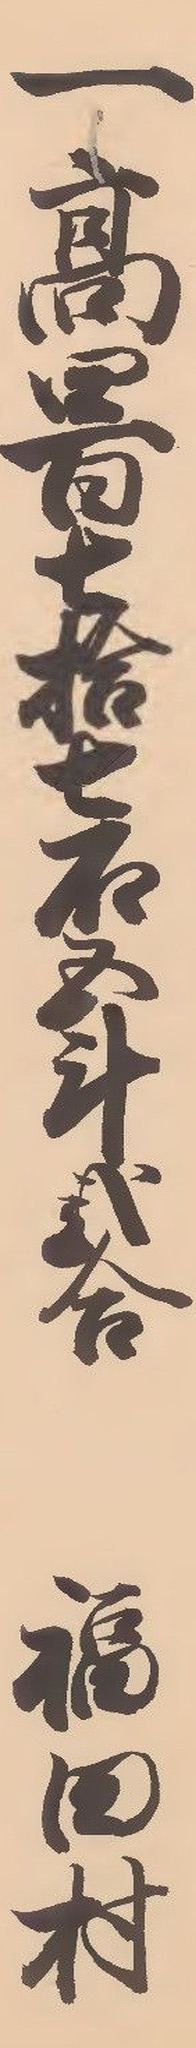一高四百七拾七石五斗弐合福田村
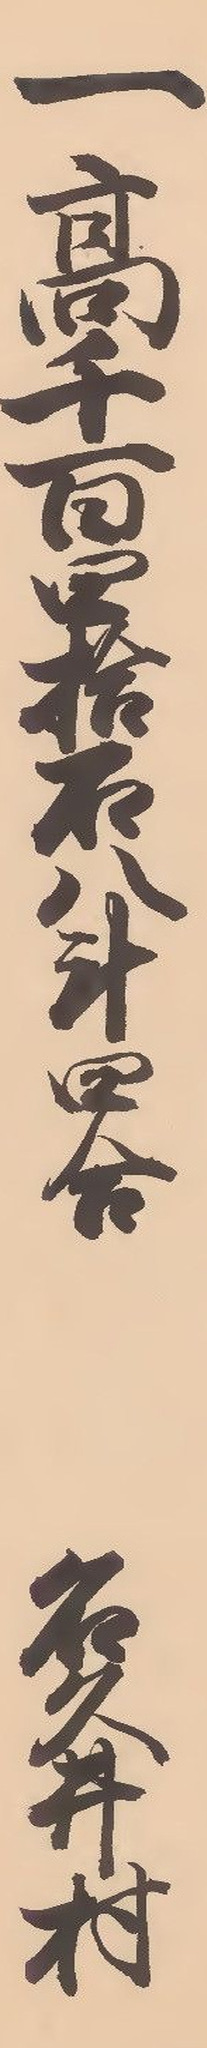一高千百四拾石八斗四合名久井村
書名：陸奥国郷帳　６
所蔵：国立公文書館 National Archives of Japan
